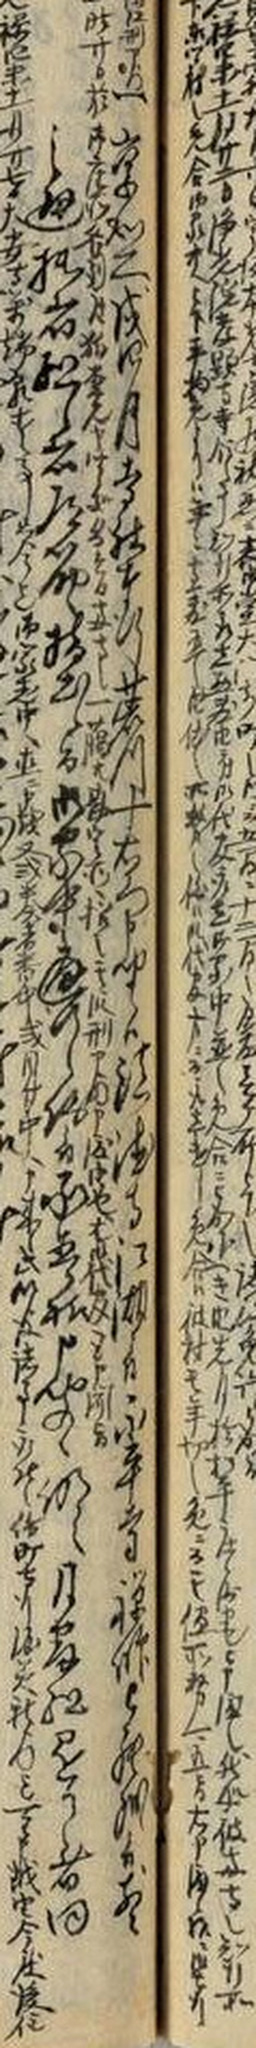一享和二戌四月寺社奉行荒川十右衛門申聞候は法徳寺江湖に付永平寺禅師被罷越に付前々
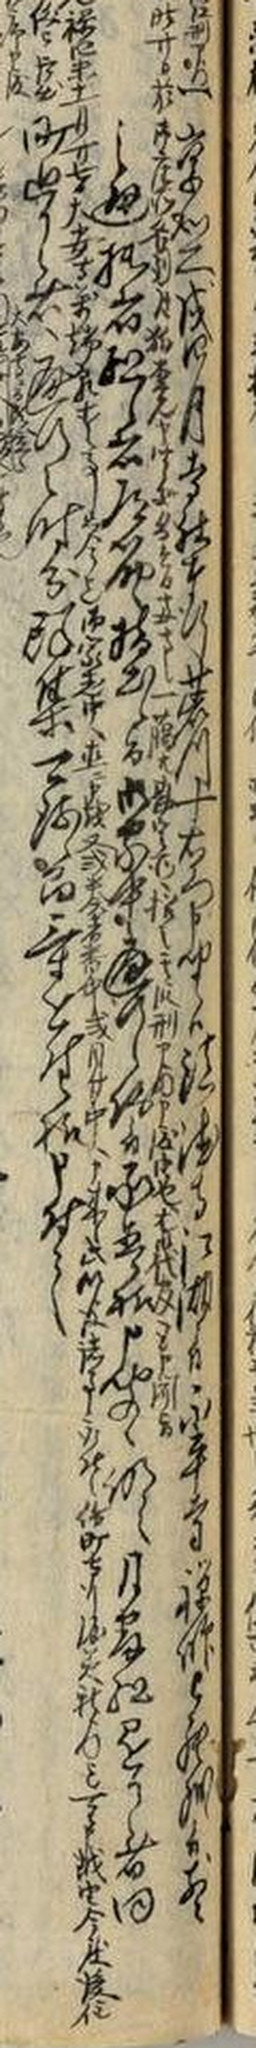之通拙者組之者道筋へ指出候旨御家中通行之儀に付承置候様申聞候仍之月番組懸り之者同
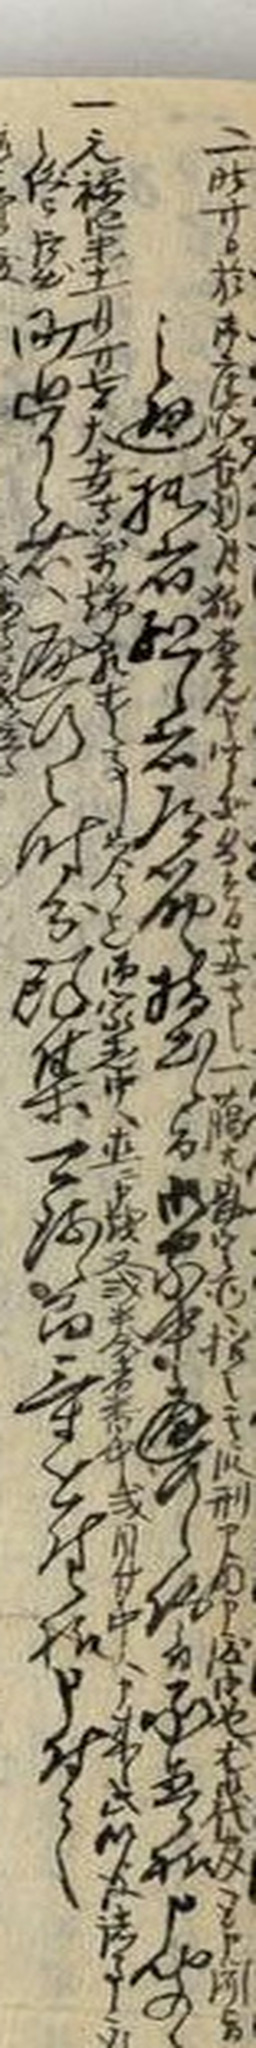町廻り之者へ通行之時分群集可致候間気を付候様申付之
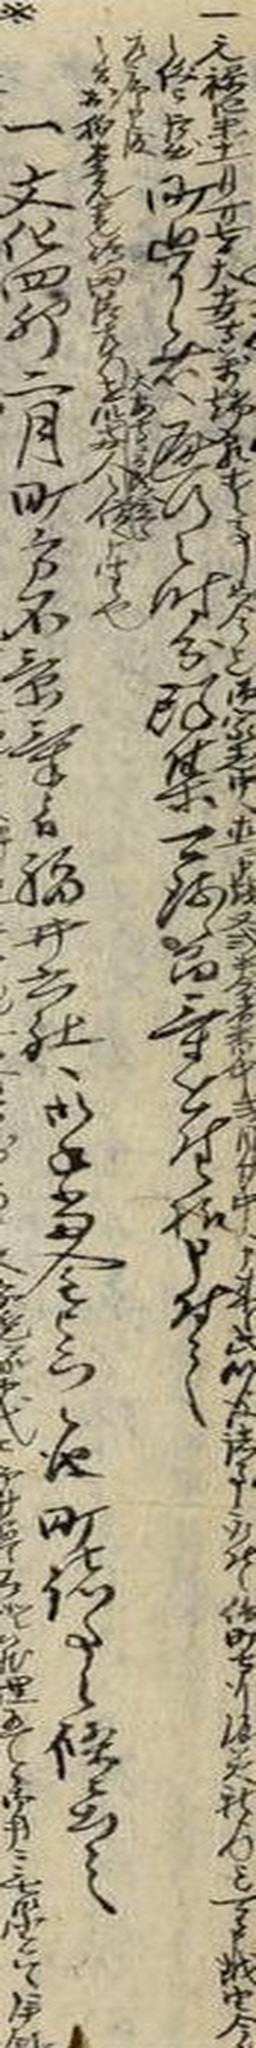一文化四卯二月町方不景気に付福井六社へ御手当金被下候儀町諸事之条に出之
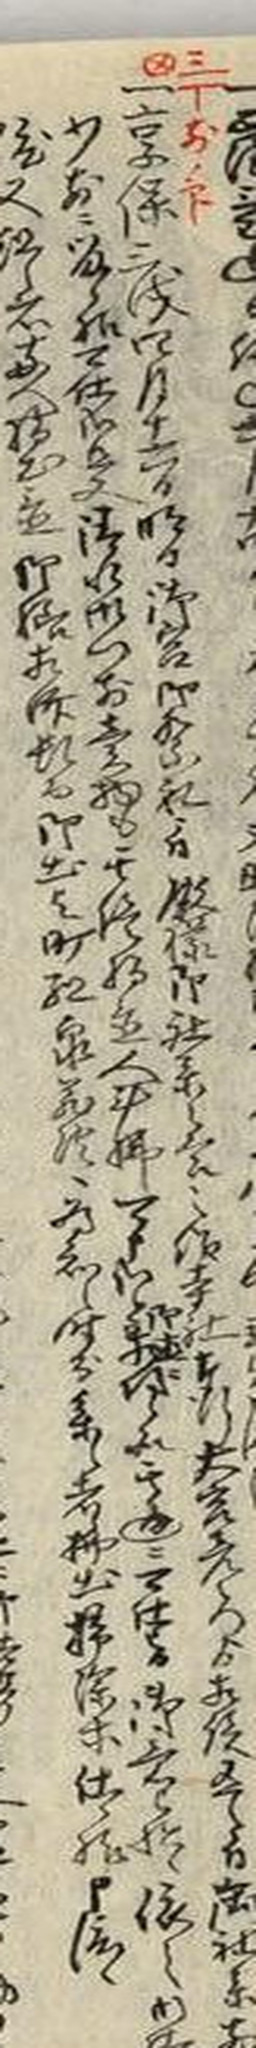渡又組之者両人指出置御膳相済頓て御出と町組泉蔵院へ為知候時分参候者払出掃除等仕候様申渡候
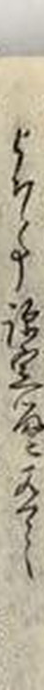被下事評定留に有之
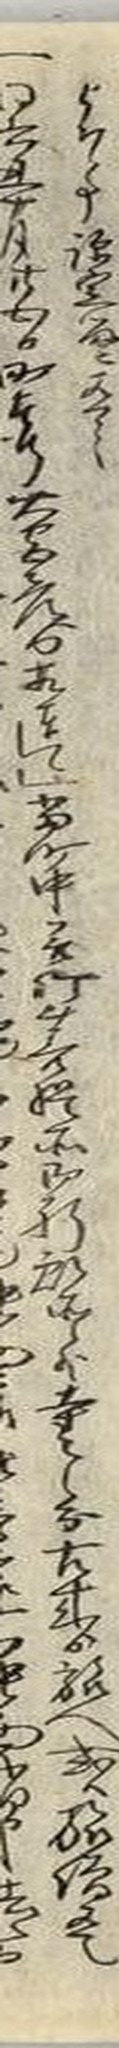一同六丑十月廿五日町奉行大宮彦右衛門相達候」当町中并御菩提所御祈願所之外寺々之分古来ゟ旅人或は旅僧有之
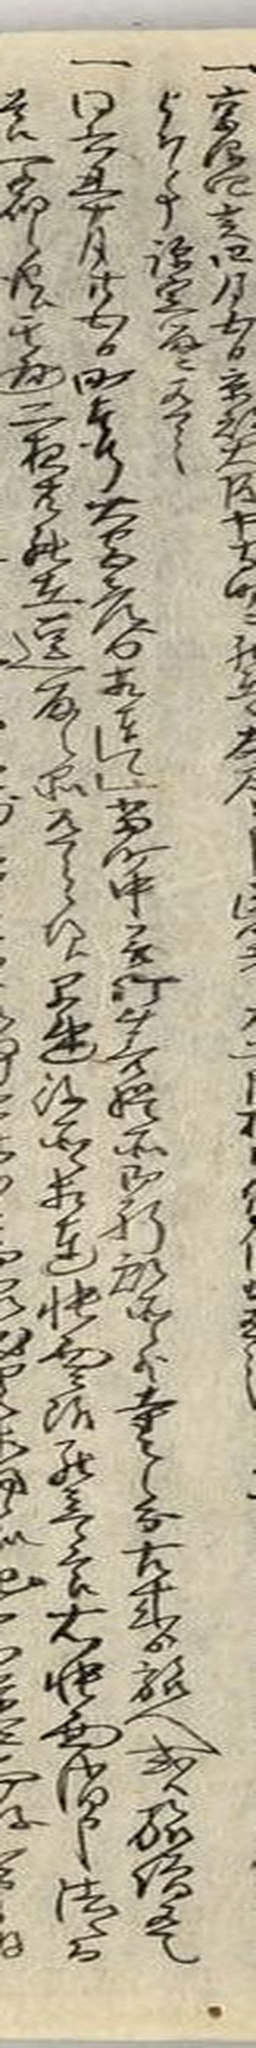節一宿之儀は其通二夜共罷在逗留之品有之候得は早速役所へ相達帳面に附罷立候節右帳面消申法候て
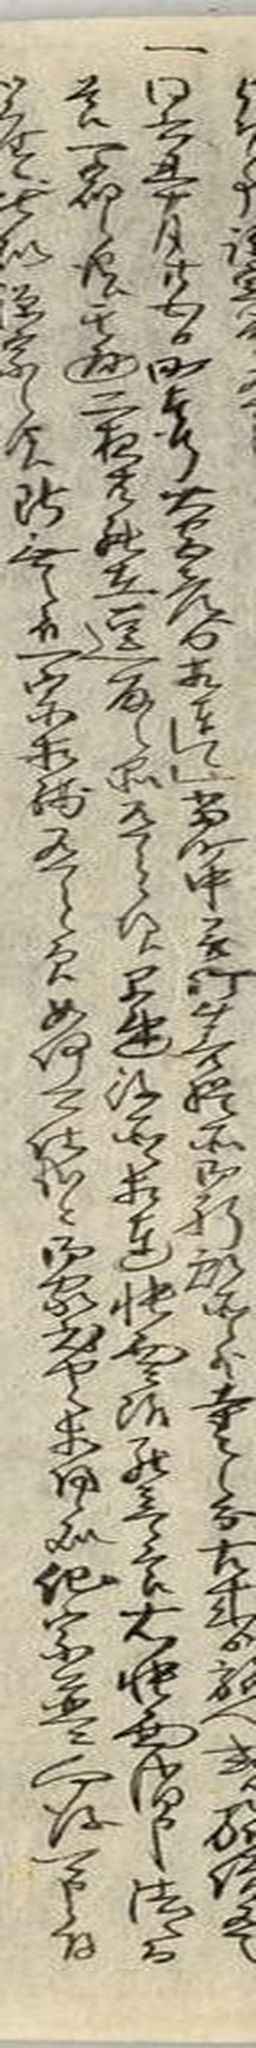御座候然処禅宗之儀は断無之に付一宗相残有之候ては如何可仕哉と御家老中へ相伺候処他宗並に向後可申付
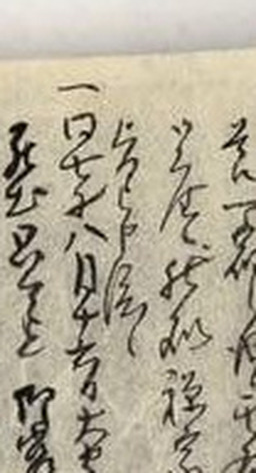旨被申渡候
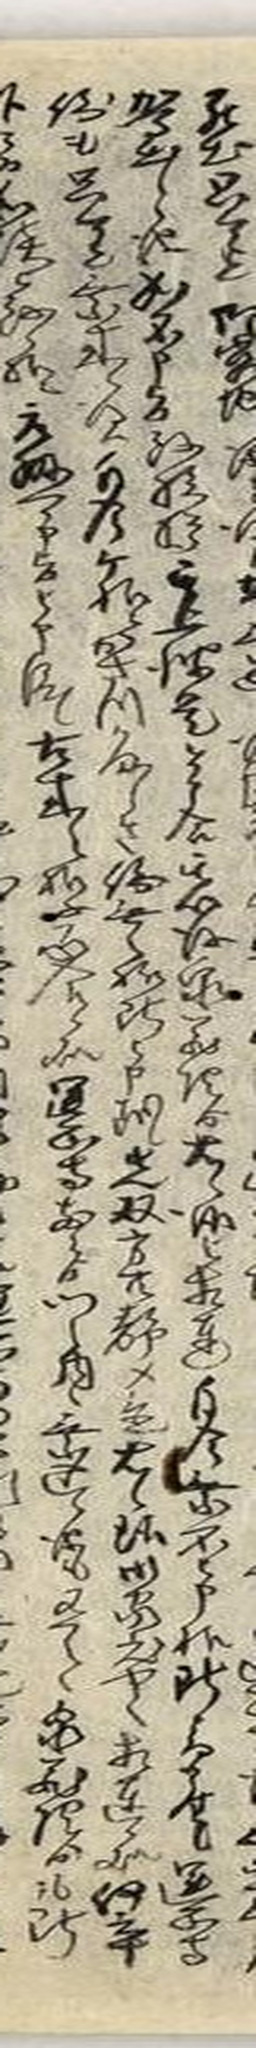下にて和談被致候様に取扱可申旨被申渡候古来之様子承合候処運正寺前々ゟ門之内へ乗込候儀も有之候泉蔵院ゟも断
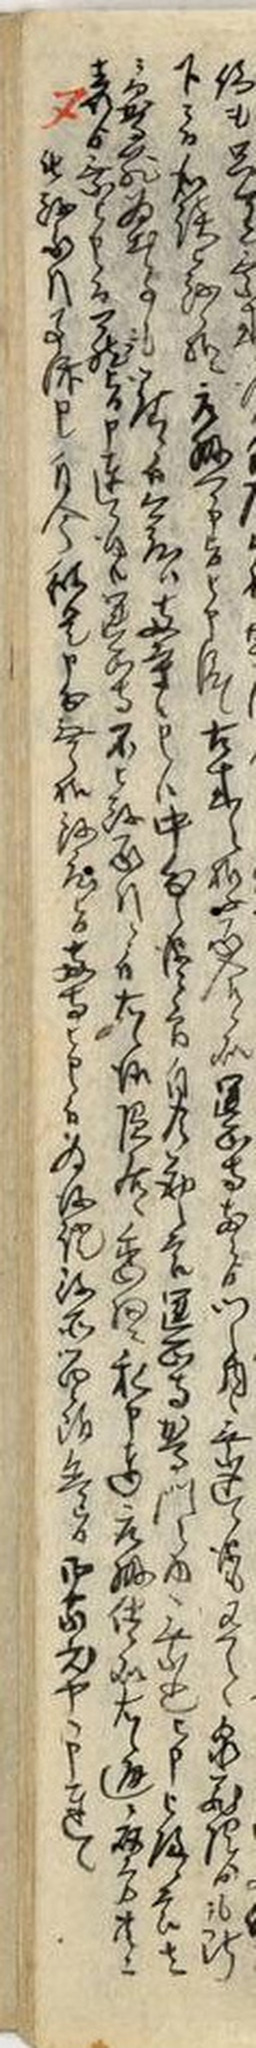表ゟ乗被申候て可然旨申達候得共運正寺不被致承引候に付右之趣隠居へ委細に私申達取扱仕候処右之通に双方共に
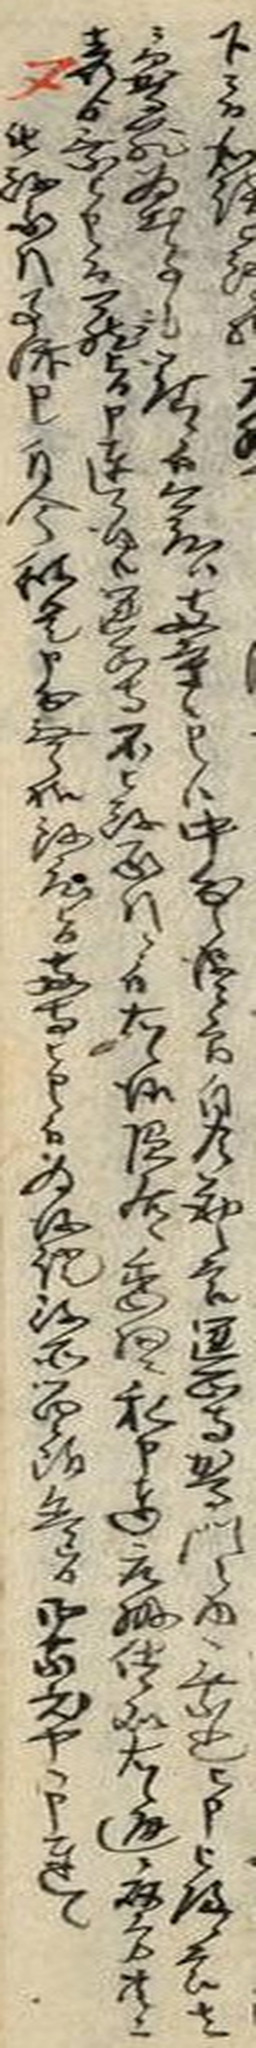被致承引事済申候自今彼是申分無之様致度旨両寺被申候付為後証役所留に附置候旨御家老中へ申達候

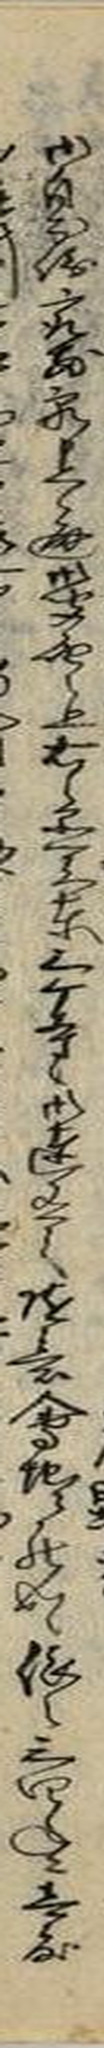御自分儀最前願申上候通御聞届之上右之品関東三ケ寺へ御達有之随意会地に罷成候依之三四年に壱度
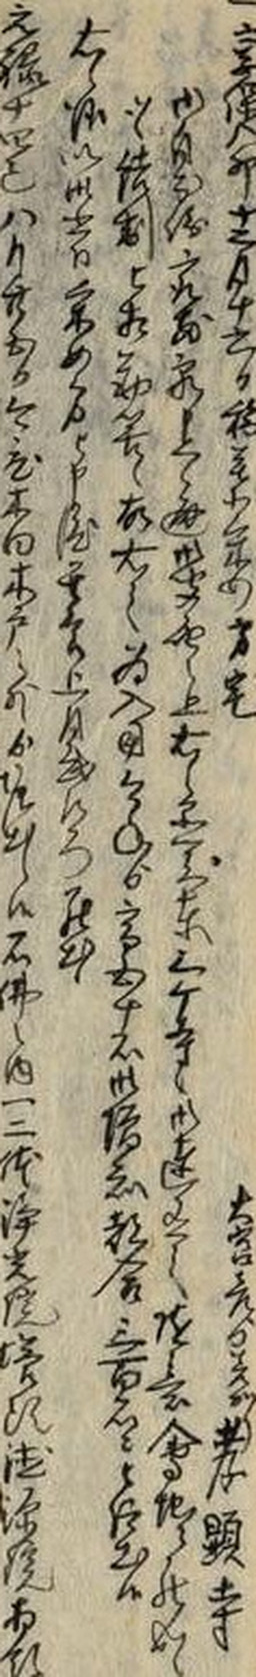ツヽ結制被相勤筈候故右之為入用今年ゟ高五十石御増知都合三百石と被仰出候
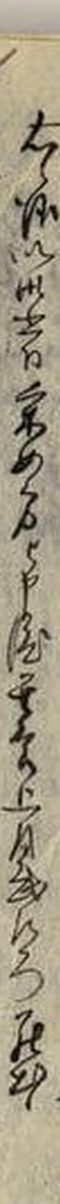右之趣以御書付采女方被申渡其節上月武左衛門罷出候
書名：御城下諸事之部
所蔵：福井県文書館 Fukui Prefectural Archives
